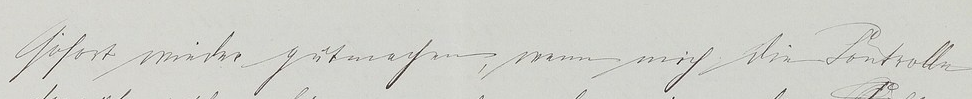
sofort wieder gutmachen, wenn mich die Controlle
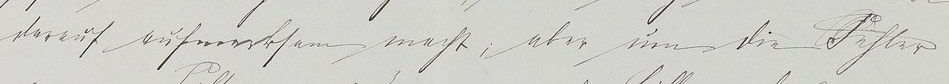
darauf aufmerksam macht; aber um die Fehler
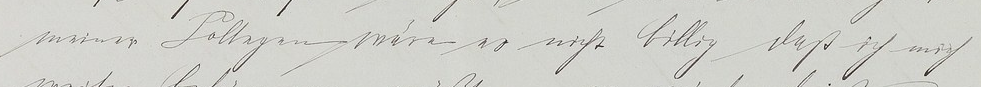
meiner Collegen wäre es nicht billig daß ich mich
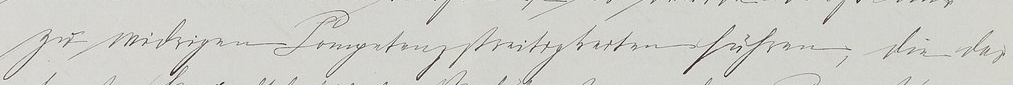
zu widrigen Competenzstreitigkeiten führen, die das
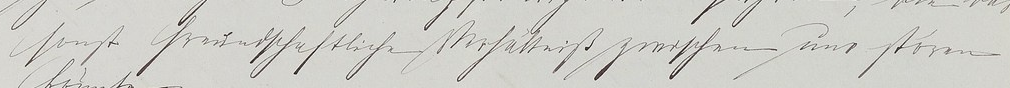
sonst freundschaftliche Verhältniß zwischen uns stören
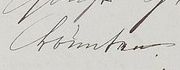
könnten.
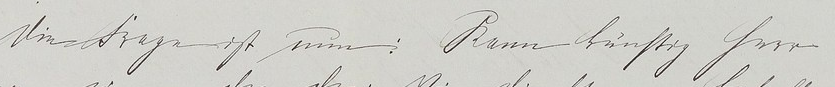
Die Frage ist nun: Kann künftig Herr
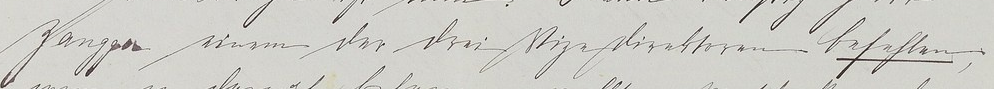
Zangger einem der drei Vize Direktoren befehlen,
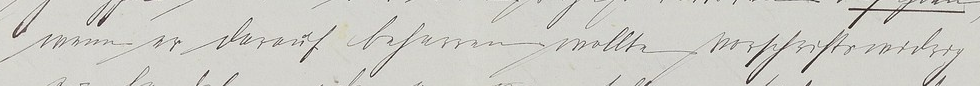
wenn er darauf beharren wollte vorschriftswidrig
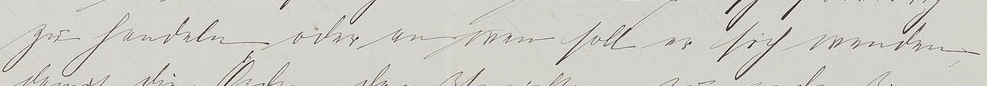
zu handeln oder an wen soll er sich wenden,
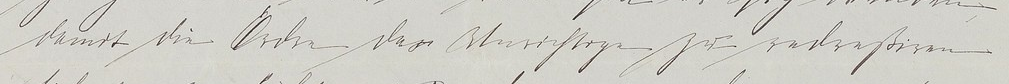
damit die Ordre das Unrichtige zu redreßiren
